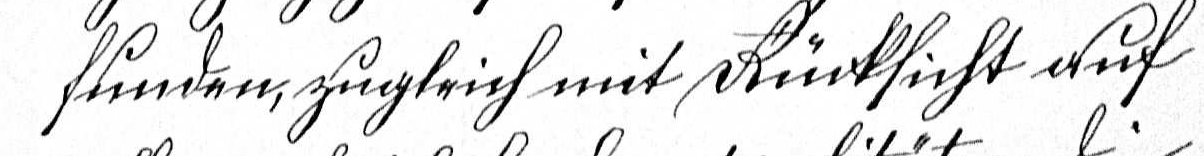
funden, zugleich mit Rücksicht auf
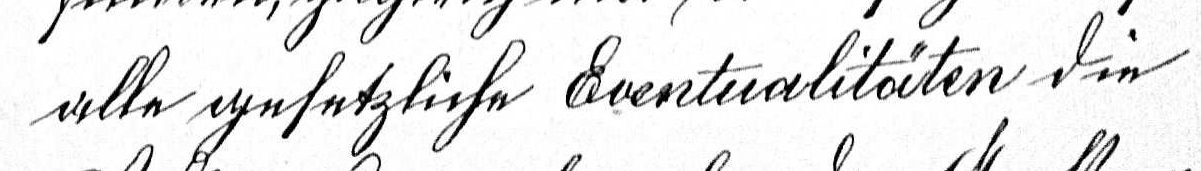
alle gesetzliche Eventualitäten die
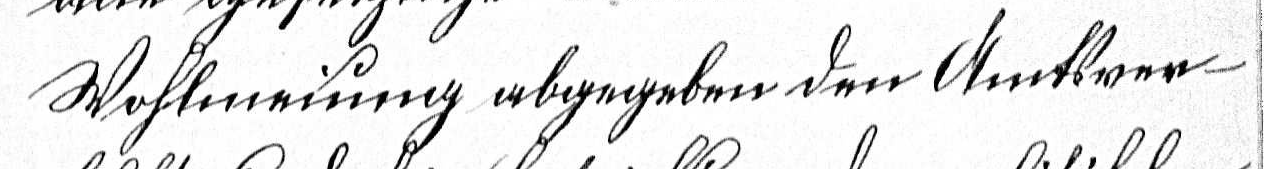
Wohlmeinung abgegeben den Amtsver¬
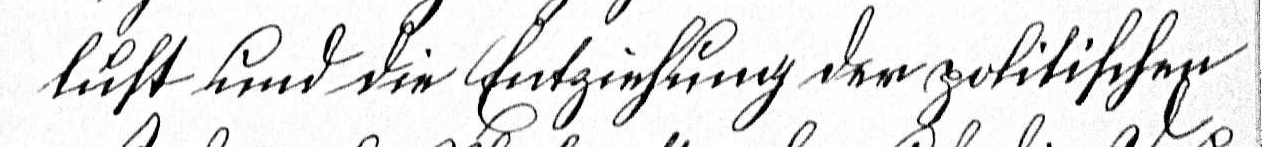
lust und die Entziehung der politischen
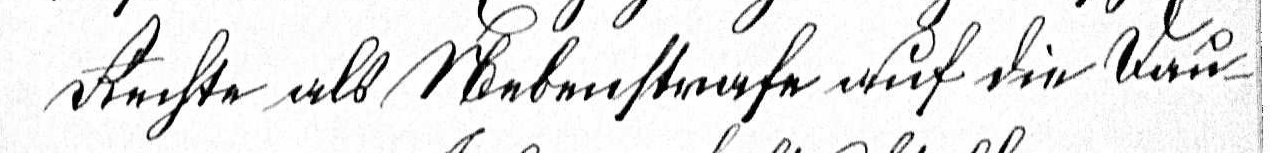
Rechte als Nebenstrafe auf die Dau¬
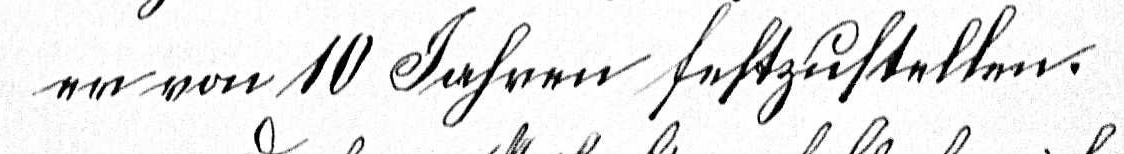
er von 10 Jahren festzustellen.
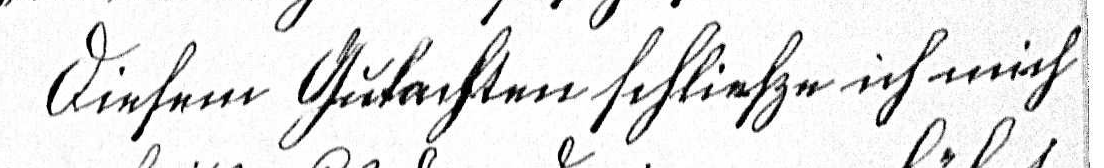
Diesem Gutachten schließe ich mich
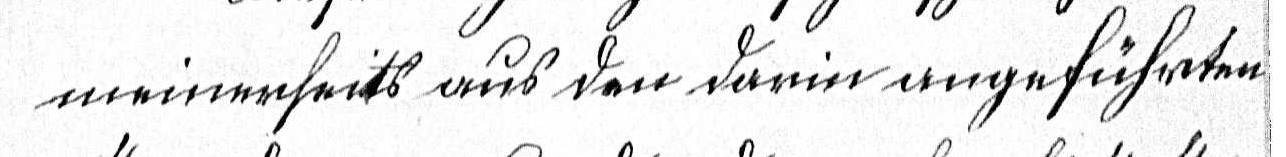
meinerseits aus den darin angeführten
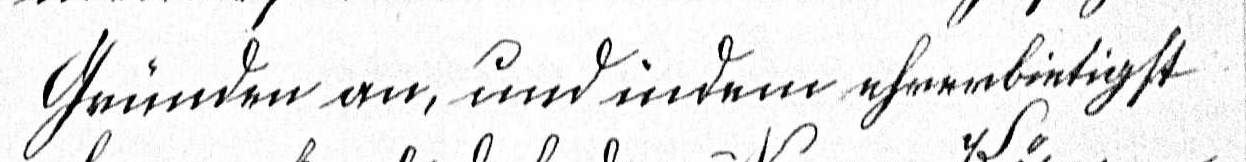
Gründen an, und indem ehrerbietigst
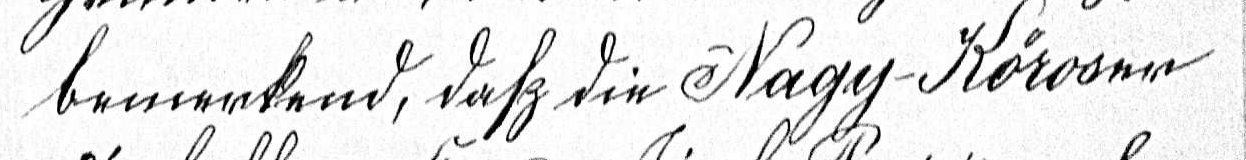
bemerkend, daß die Nagy-Kőröser
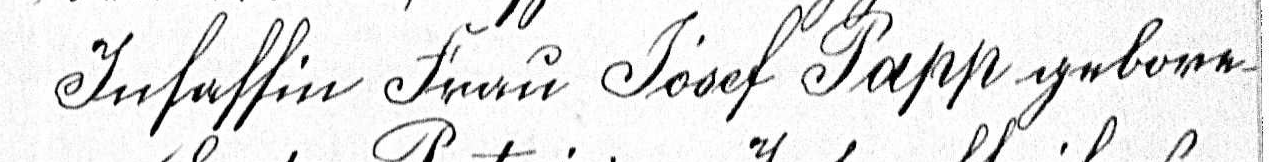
Insassin Frau Jósef Papp gebore¬
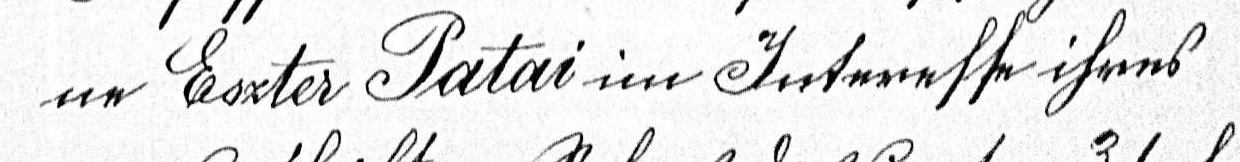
ne Eszter Patai im Interesse ihres
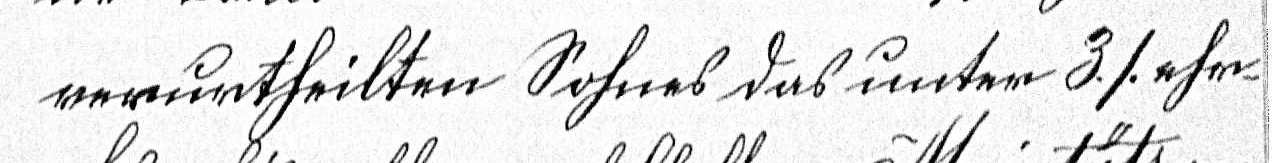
verurtheilten Sohnes das unter 3) ehr¬
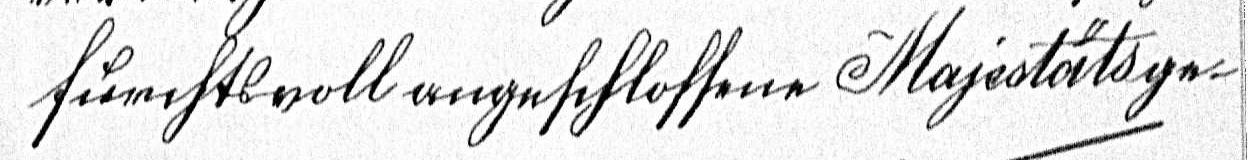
furchtsvoll angeschlossene Majestätsge¬
